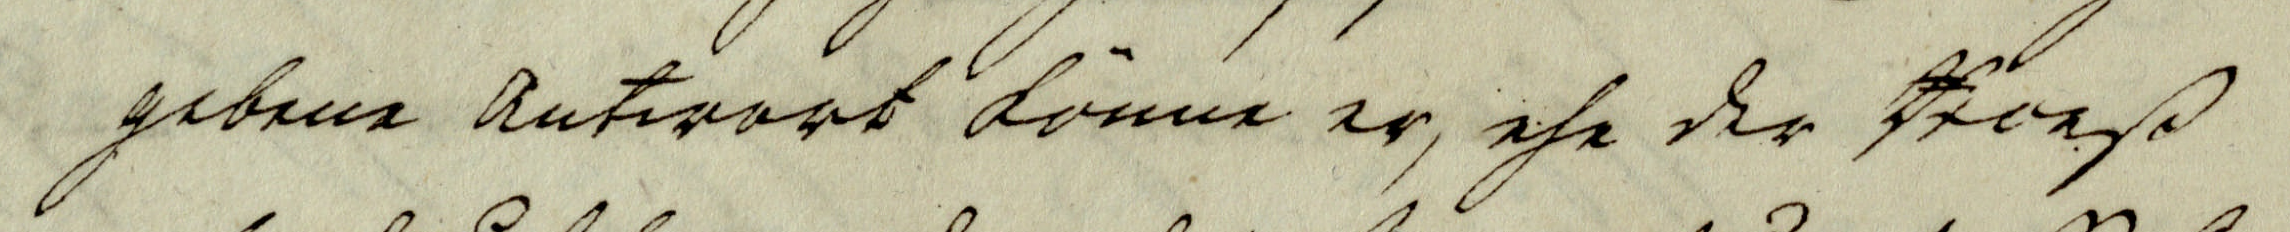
gebene Antwort könne er, ehe der Receß
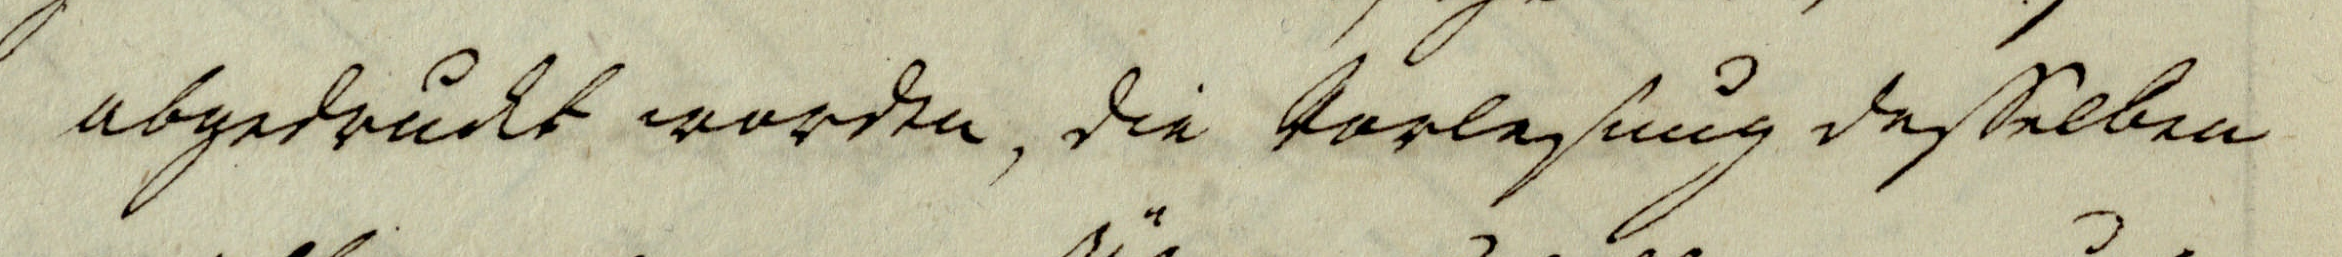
abgedruckt worden, die Vorlesung desselben
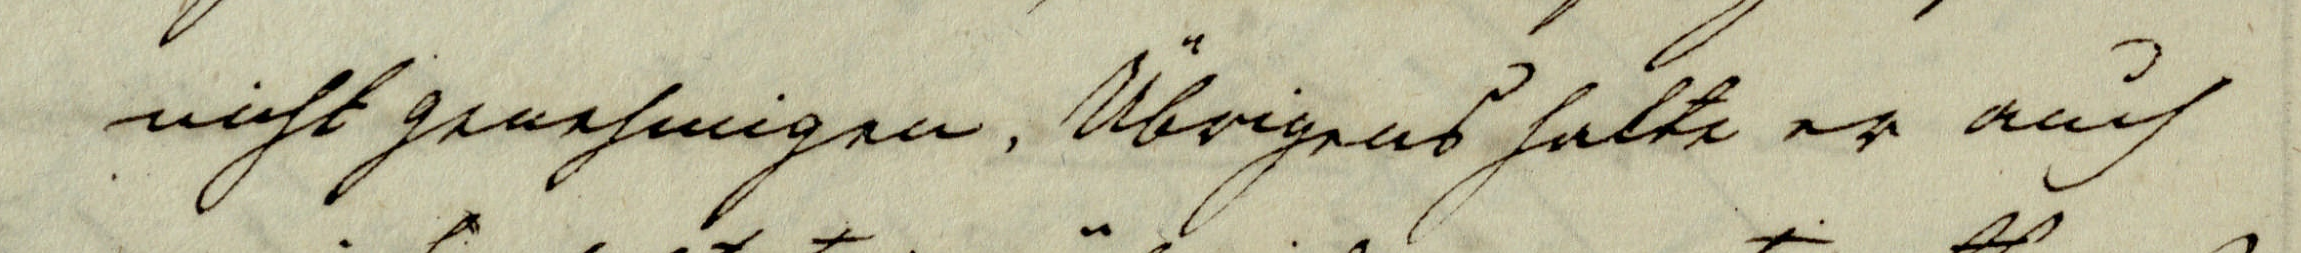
nicht genehmigen. Übrigens halte er auch
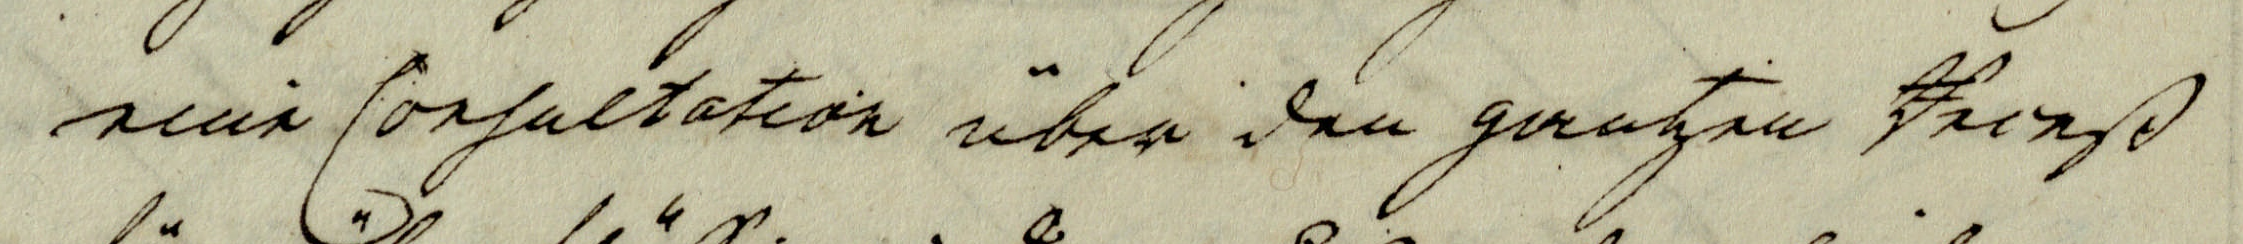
eine Consultation über den gantzen Receß
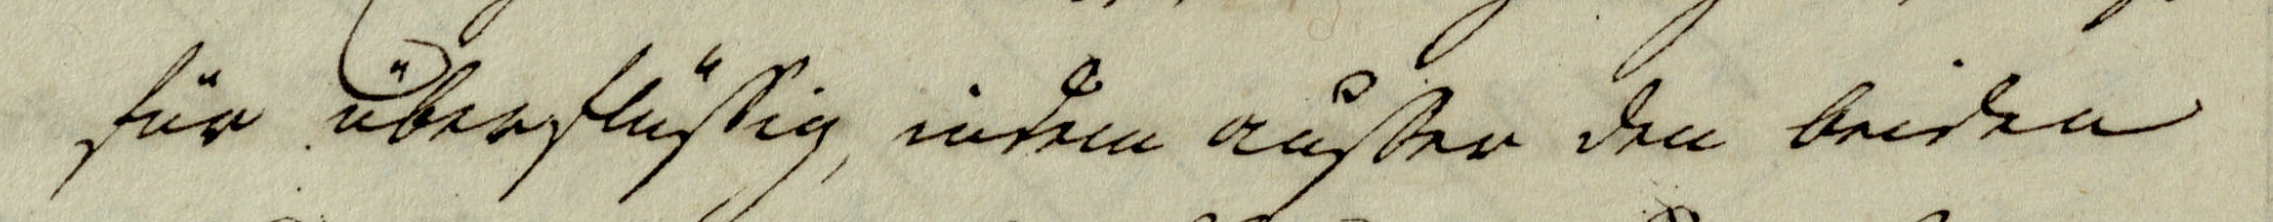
für überflüssig, indem ausser den beiden
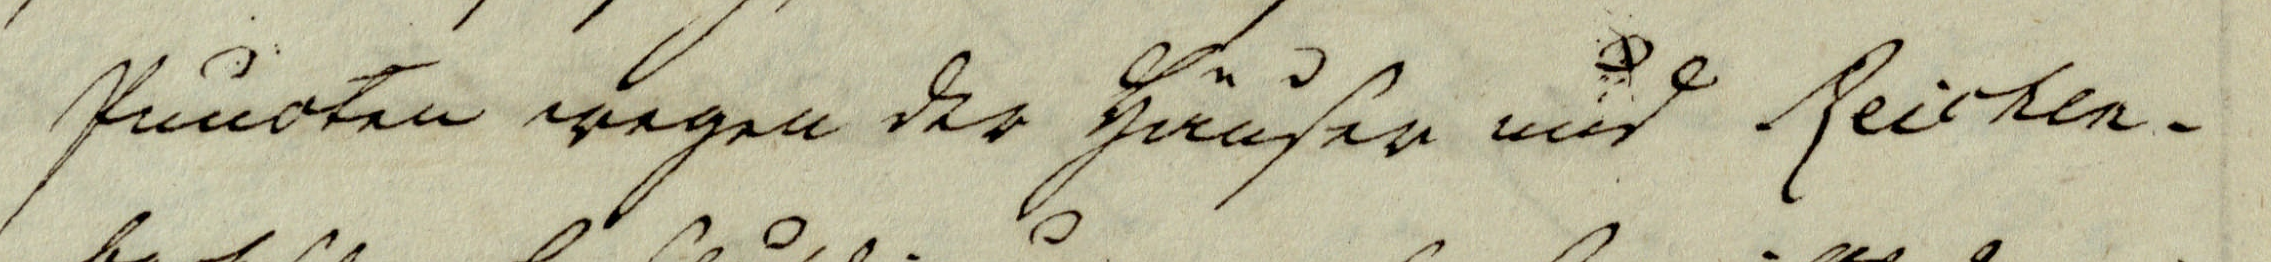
Puncten wegen der Häuser und Reichen¬
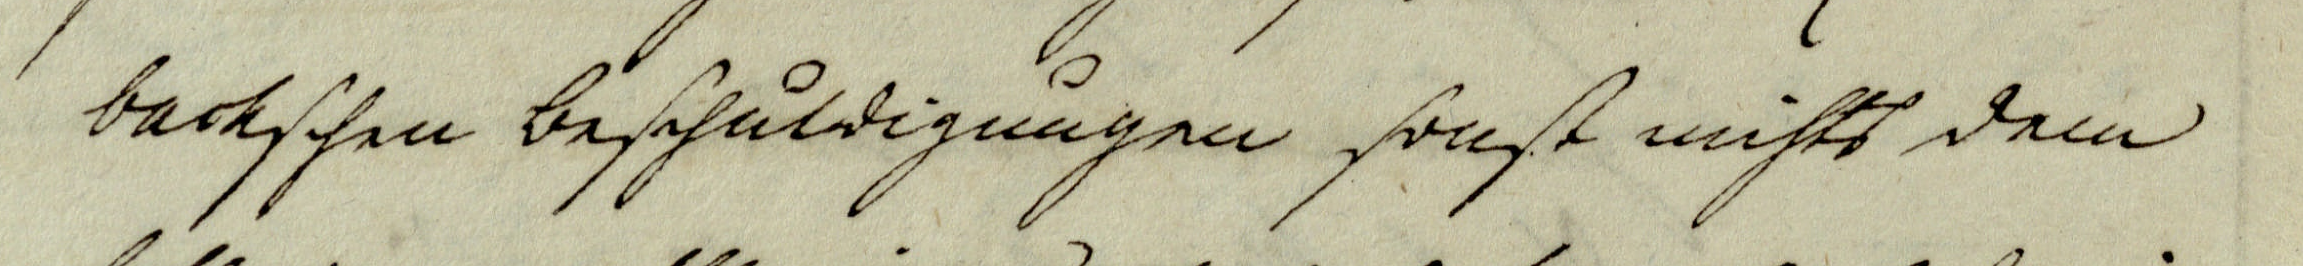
bachschen Beschuldigungen sonst nicht dem
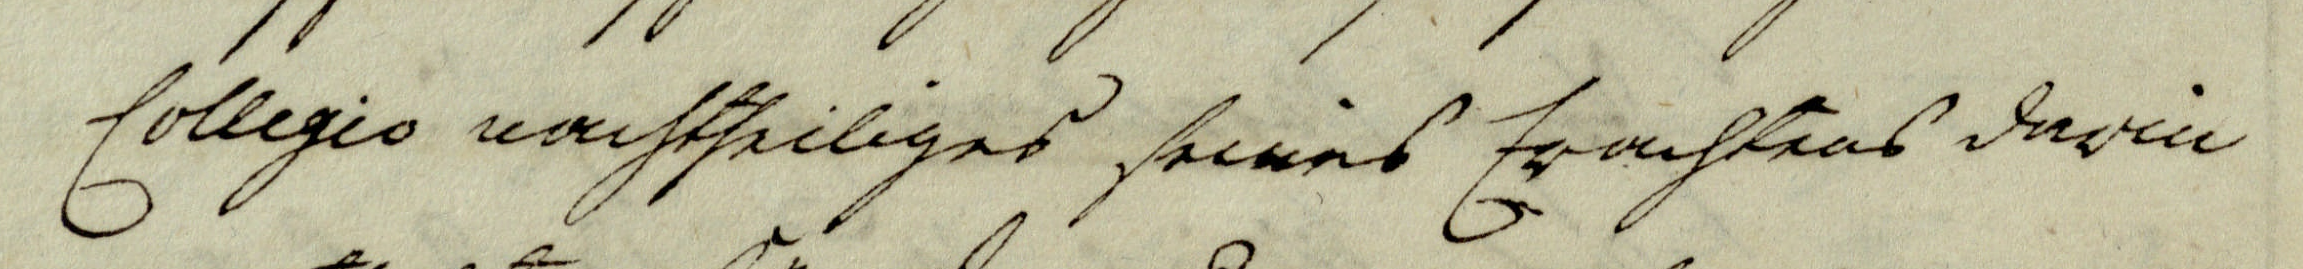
Collegio nachtheiliges seines Erachtens darin
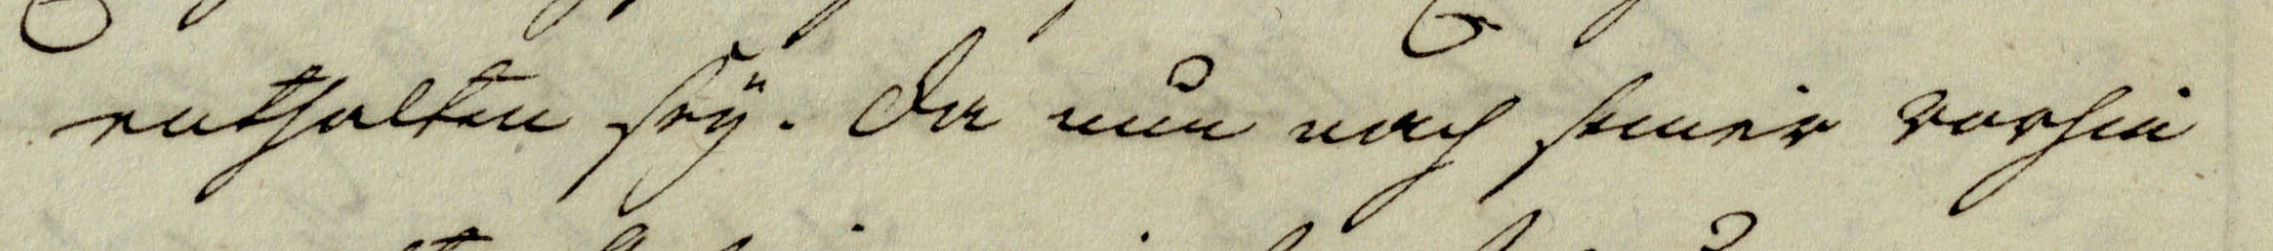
enthalten seÿ. Da nun nach seiner vorhin
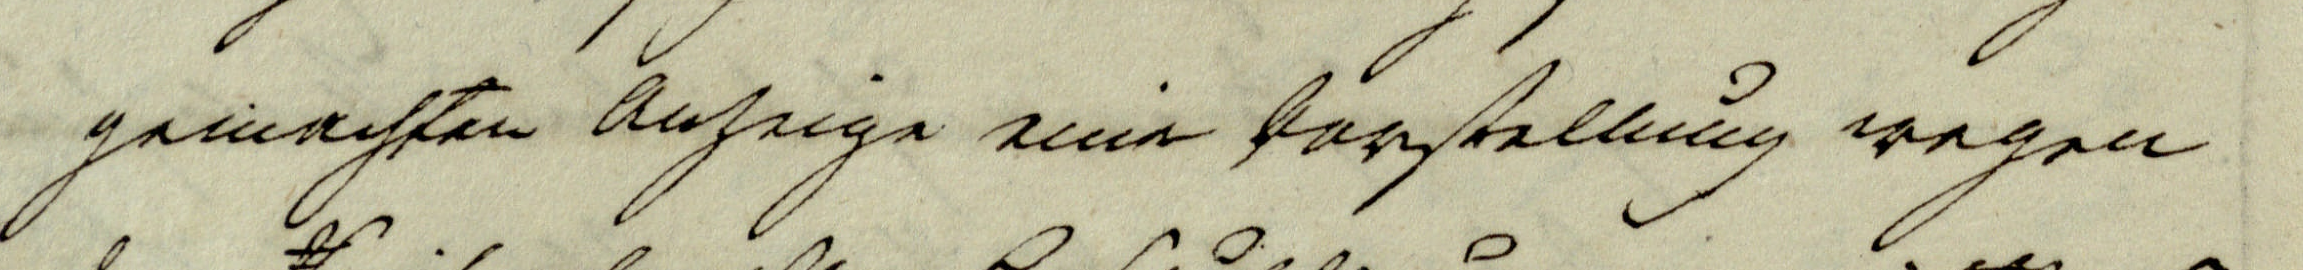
gemachten Anzeige eine Vorstellung wegen
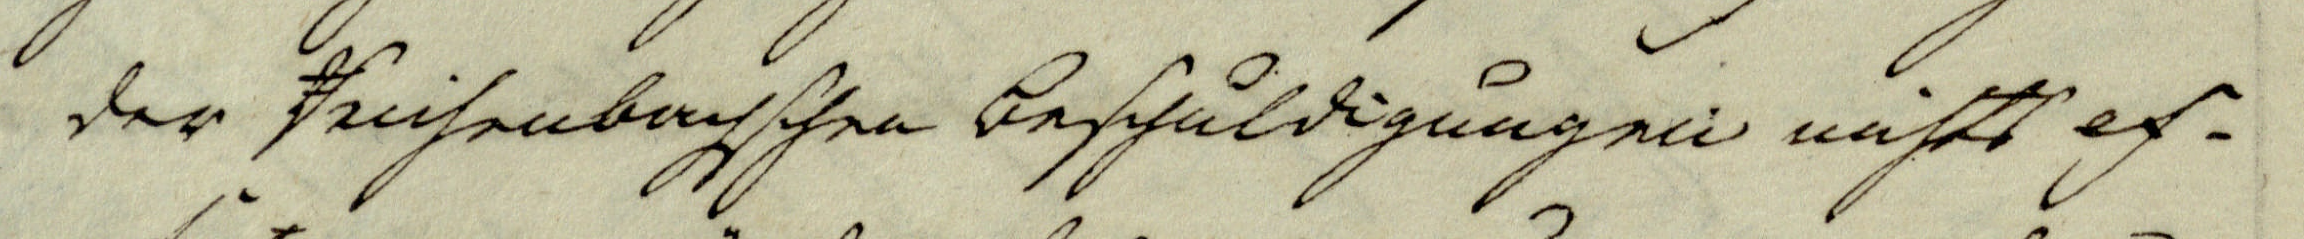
der Reichenbachschen Beschuldigungen nichts ef¬
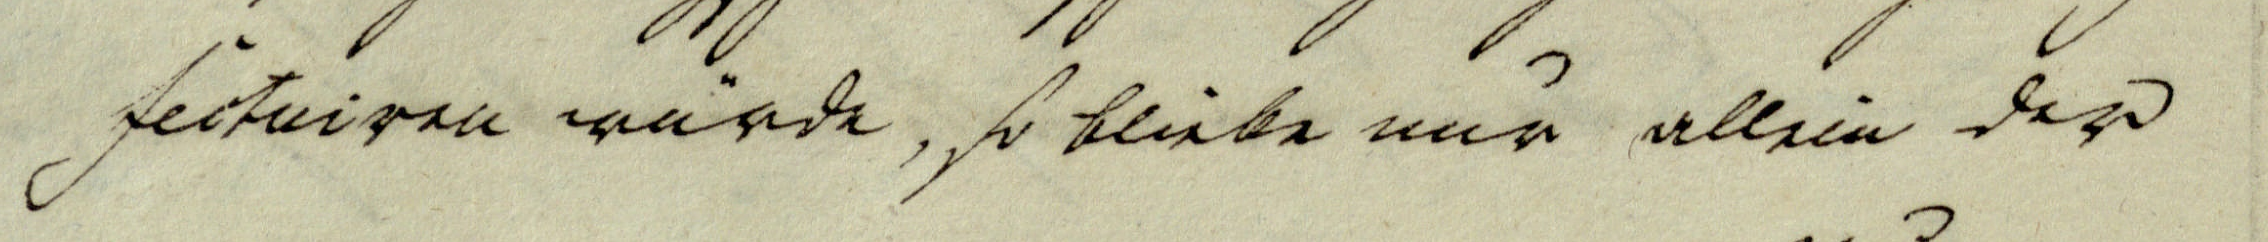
fectuiren würde, so bliebe nur allein der
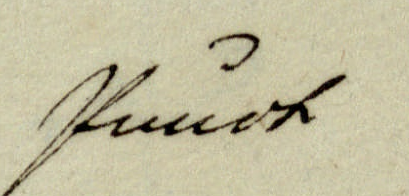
Punct
